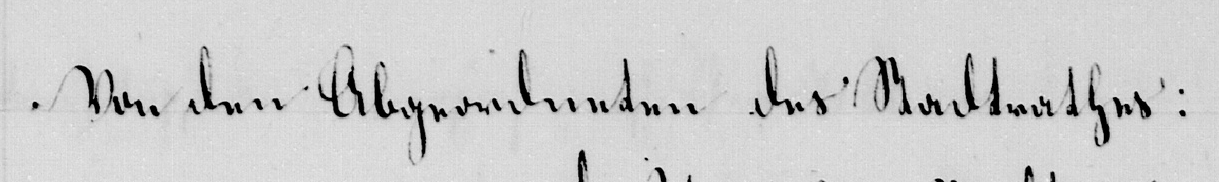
Von den Abgeordneten des Stadtrathes:
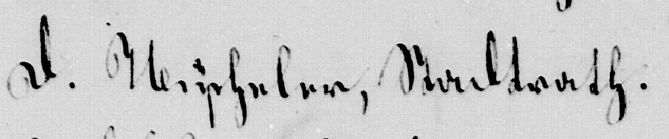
D. Nüscheler, Stadtrath.
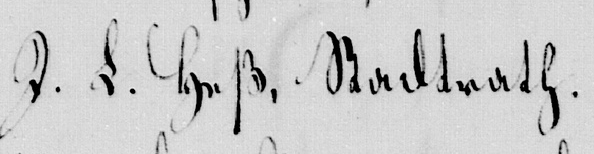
J. L. Heß, Stadtrath.
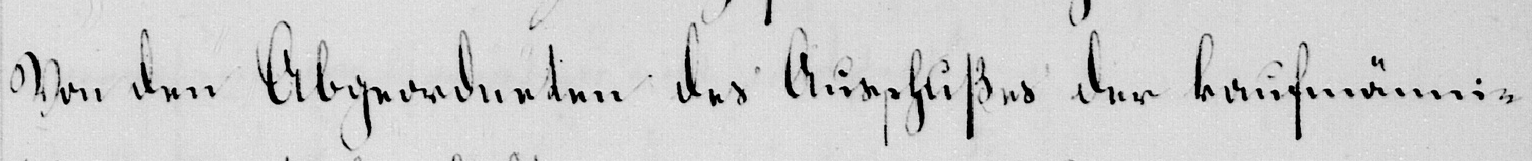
Von den Abgeordneten des Ausschußes der kaufmänni¬
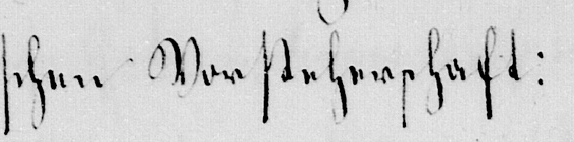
schen Vorsteherschaft:
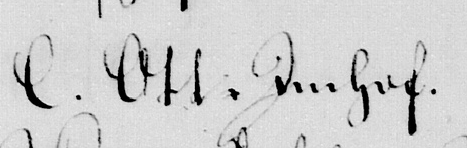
C. Ott-Imhof.
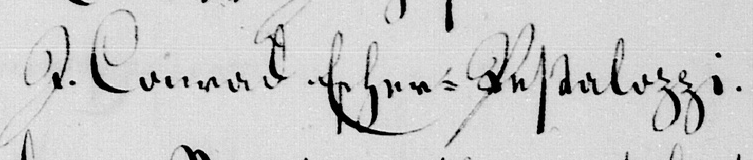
J. Conrad Escher-Pestalozzi.
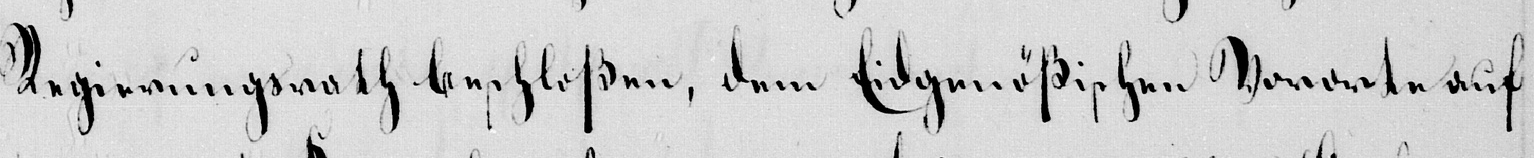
Regierungsrath beschloßen, dem Eidgenößischen Vororte auf
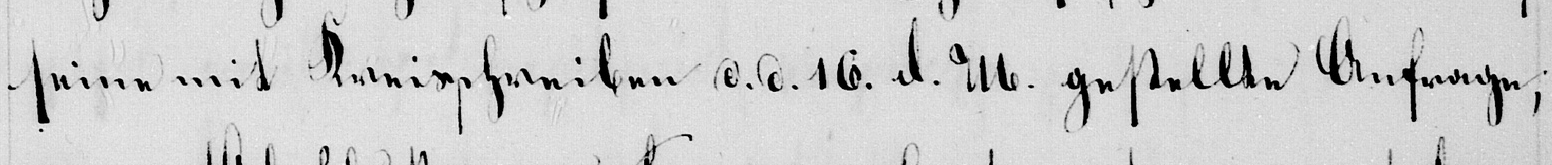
seine mit Kreisschreiben d. d. 16. d. M. gestellte Anfrage,
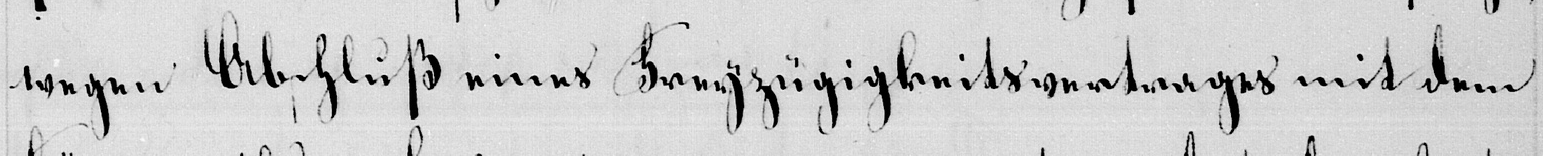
wegen Abschluß eines Freyzügigkeitsvertrages mit dem
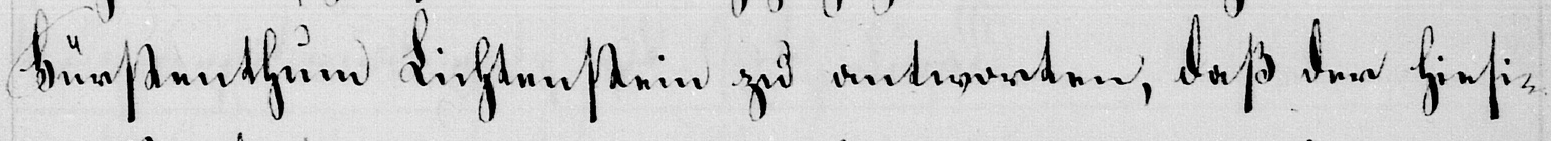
Fürstenthum Lichtenstein zu antworten, daß der hiesi¬
